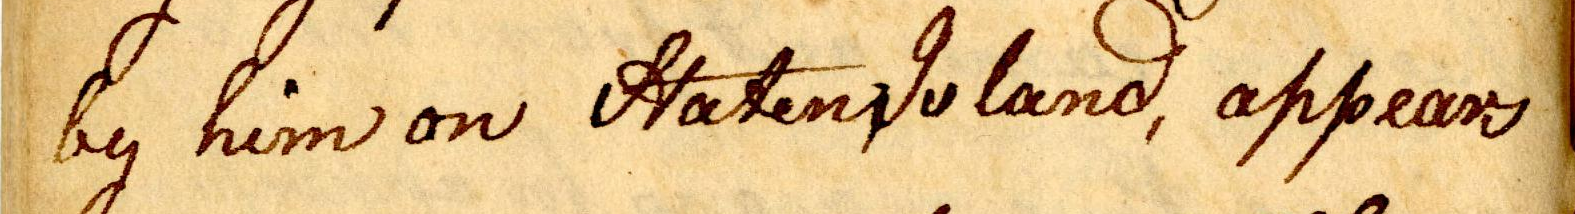by him on Staten Island, appears
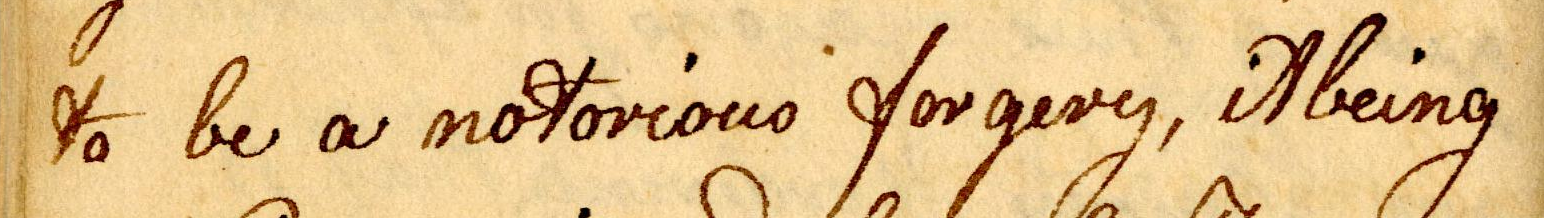to be a notorious forgery, it being
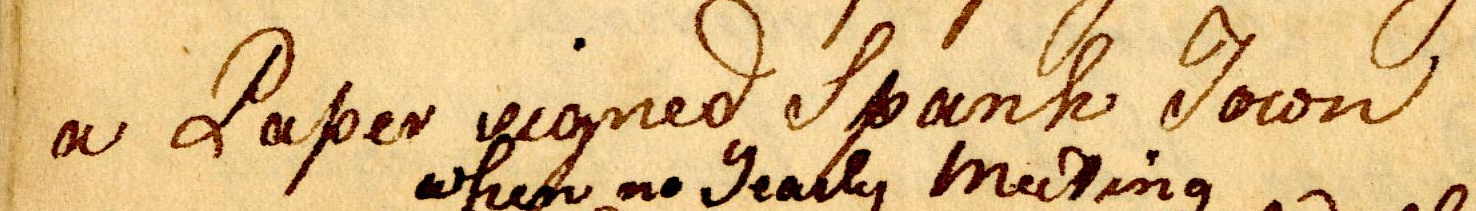a Paper signed Spank Town
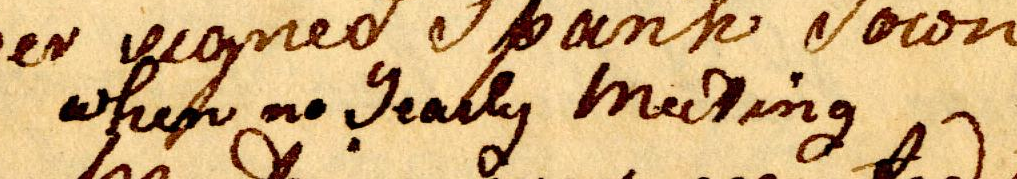when no Yearly Meeting
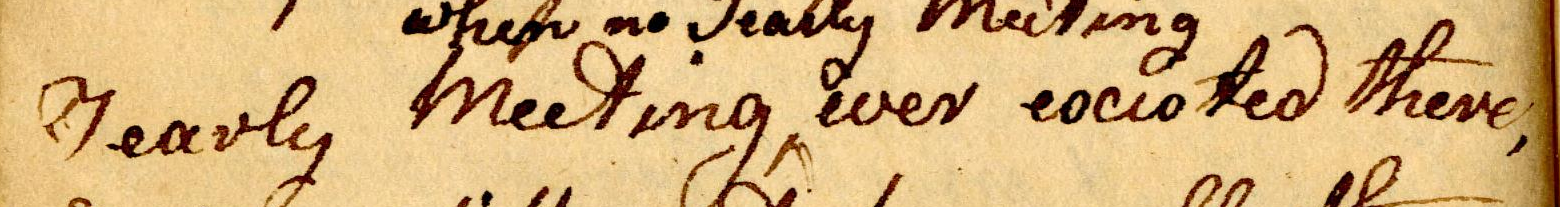Yearly Meeting ^ ever existed there,
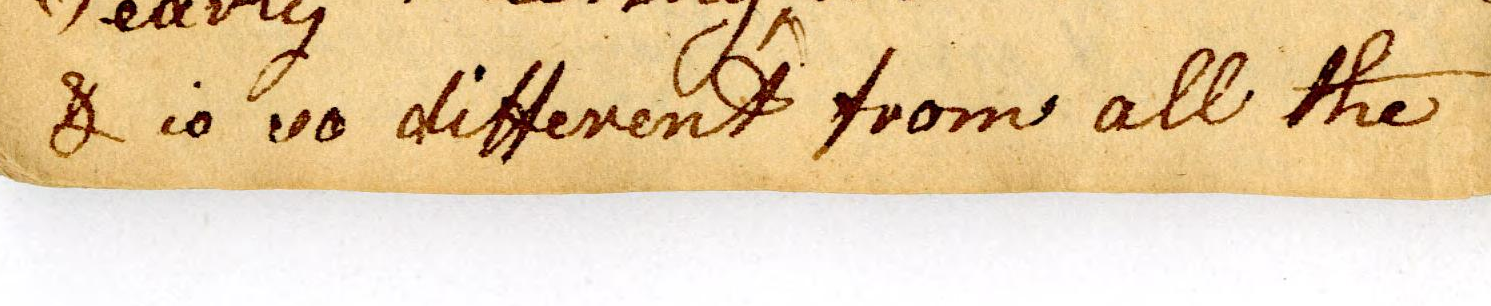& is so different from all the
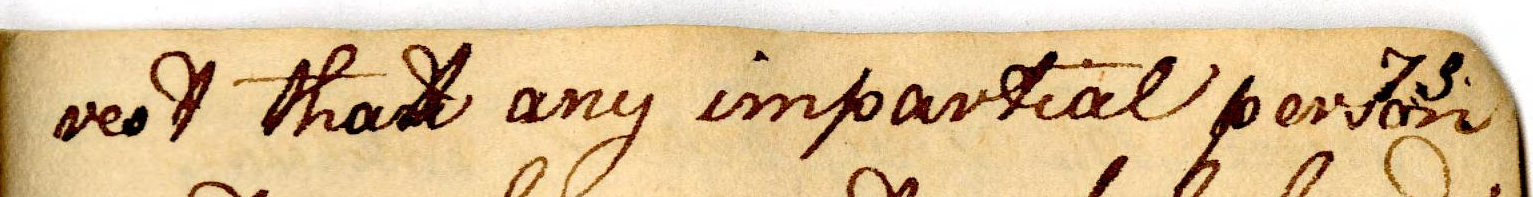rest that any impartial person
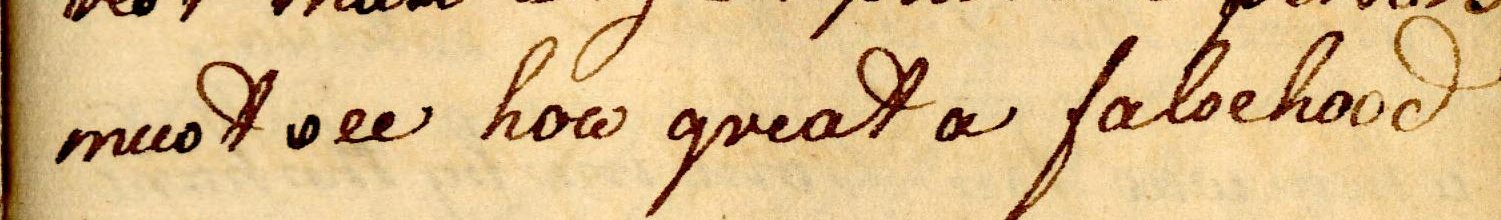must see how great a falsehood
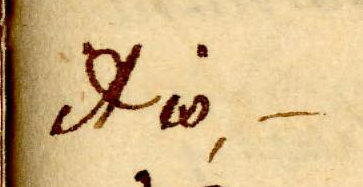it is,-
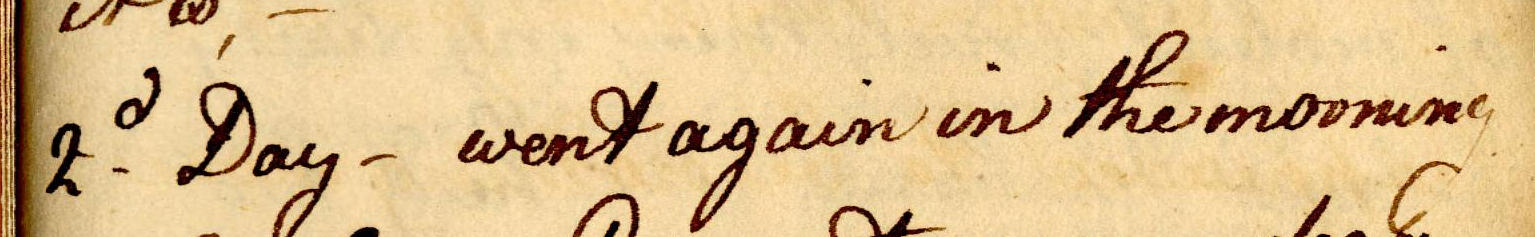2^d. Day- went again in the morning
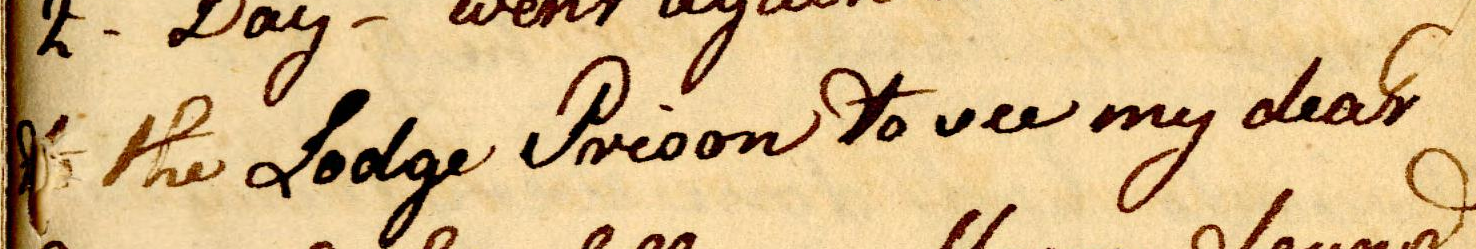to the Lodge Prison to see my dear
